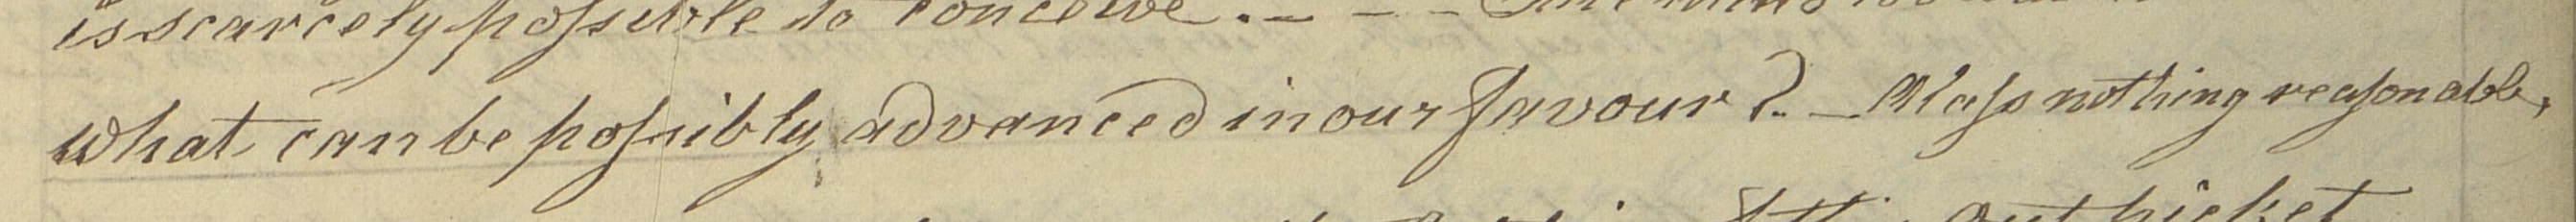What can be possibly advanced in our favour? Alas nothing reasonable,
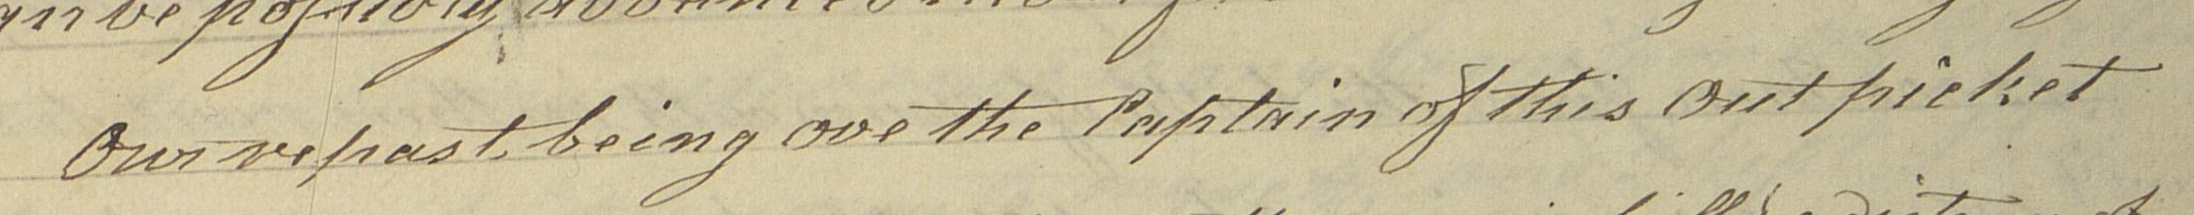Our repast being ove the Captain of this out picket
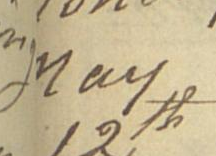May
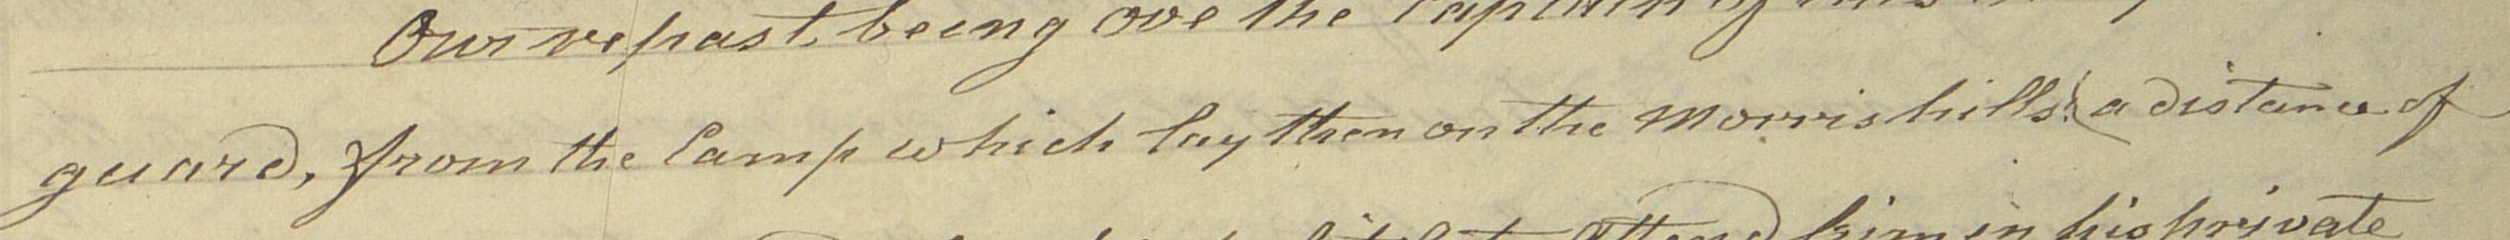guard, from the camp which by then on the Morris hills (a distance of
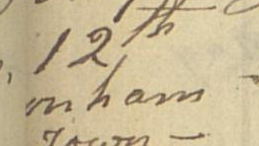-unham
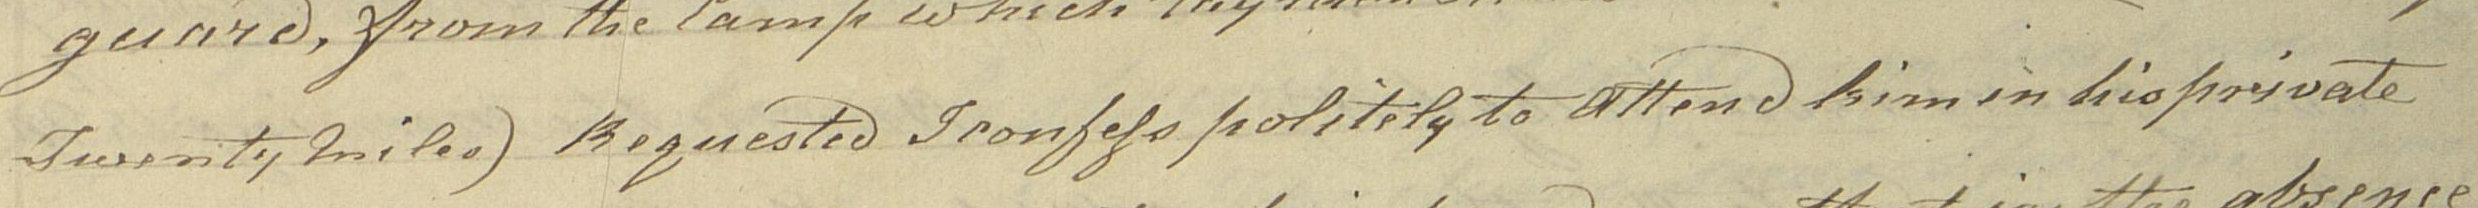Twenty miles) Requested I confess politely to attend him in his private
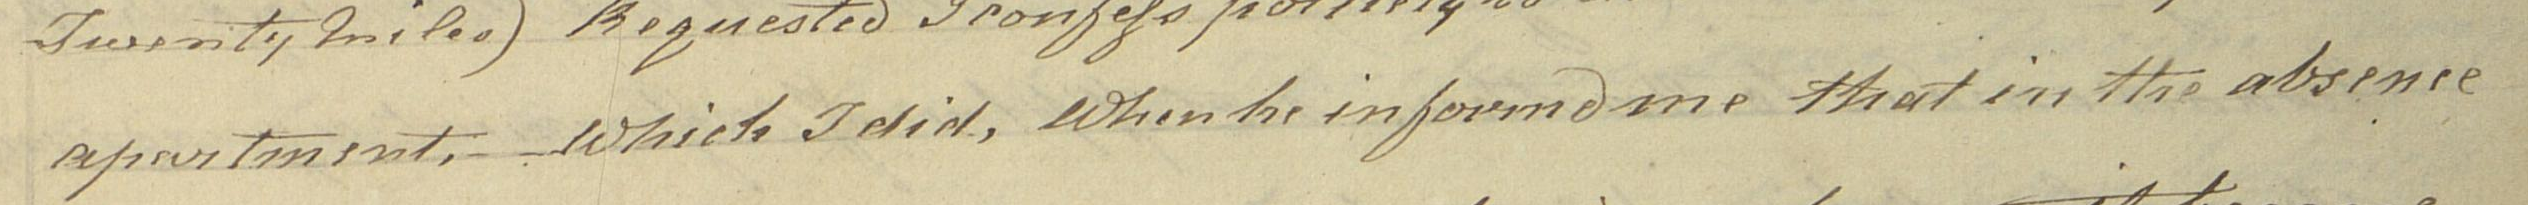apartment, which I did, when he inform'd me that in the absence
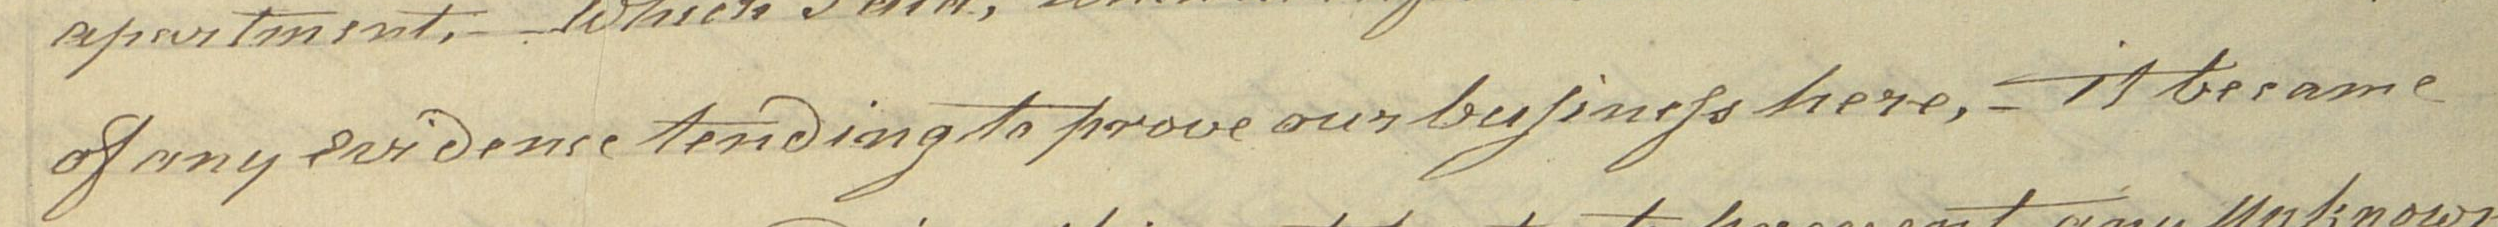of any evidence tending to prove our business here, it became
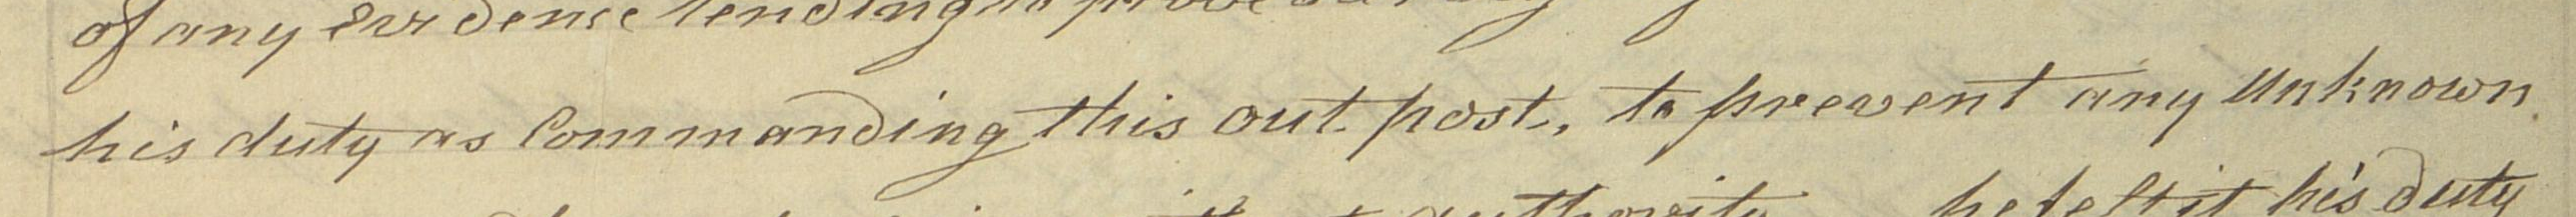his duty as commanding this outpost to prevent any unknown
